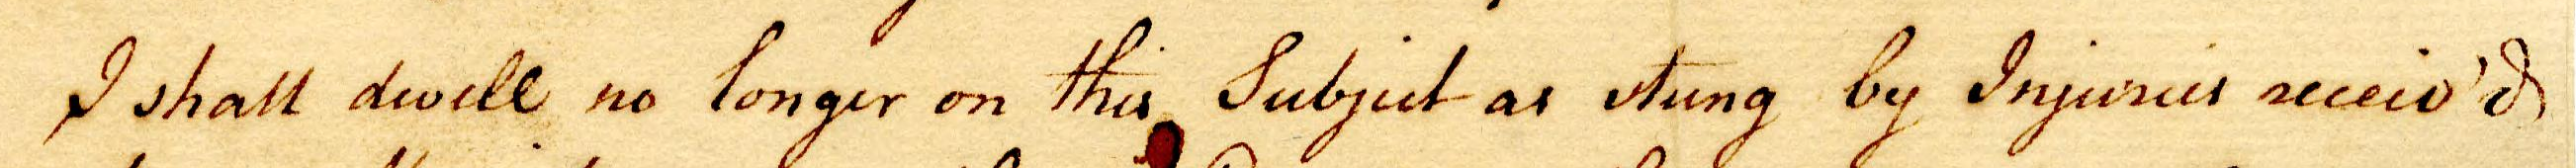I shall dwell no longer on this Subject as stung by Injuries receiv'd
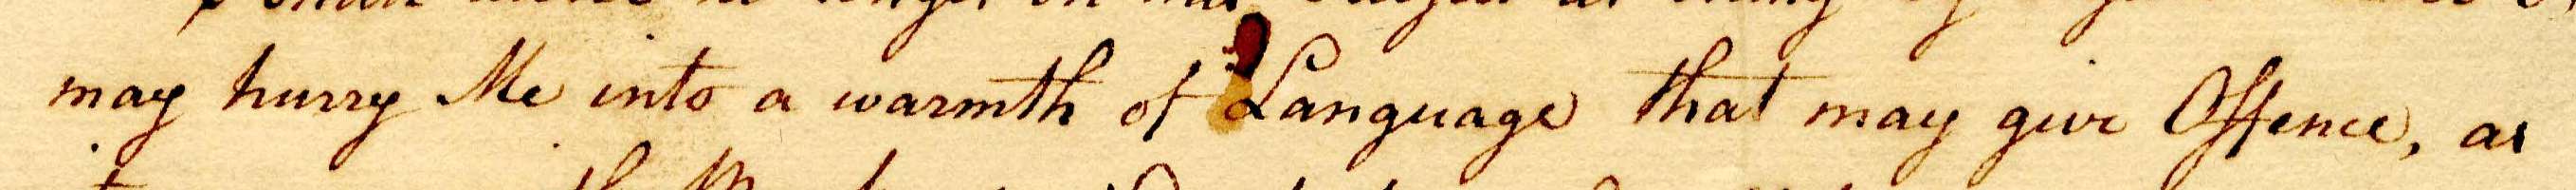may hurry Me into a warmth of Language that may give Offence, as
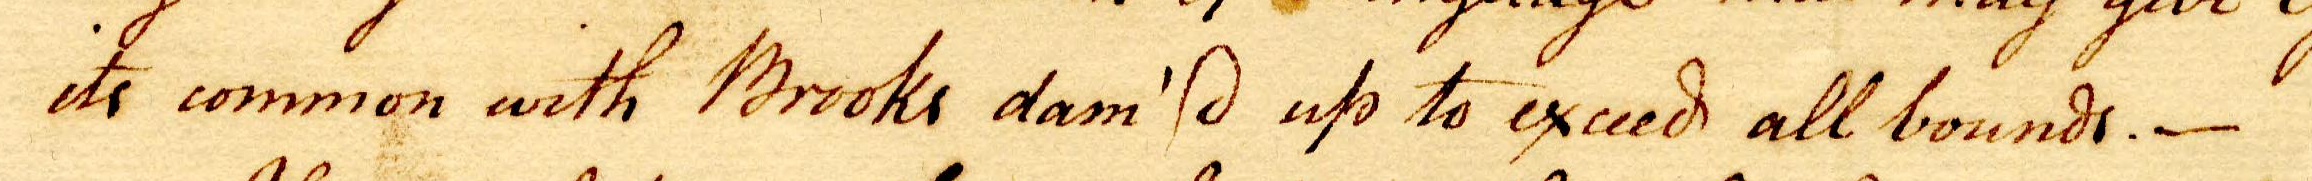its common with Brooks dam'd up to exceed all bounds.
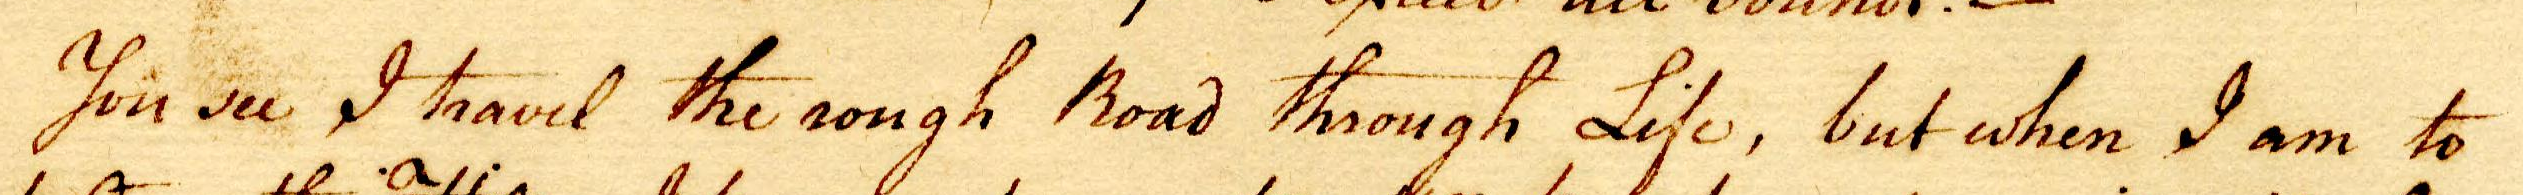You see I travel the rough Road through Life, but when I am to
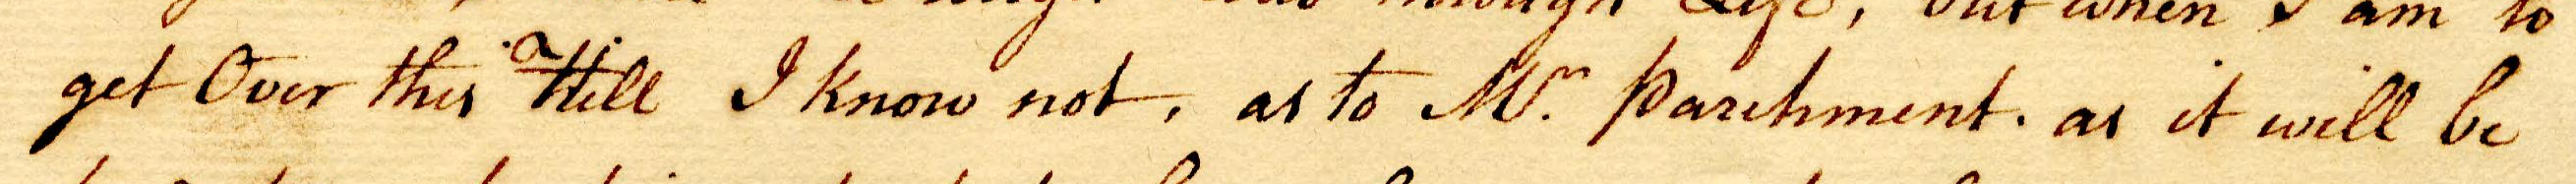get Over this Hill I know not, as to M^rs. Parchment as it will be
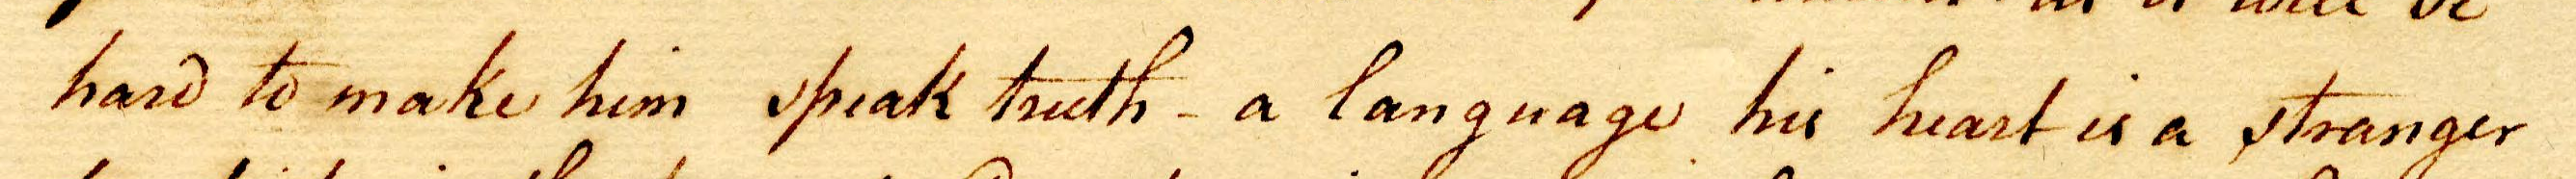hard to make him speak truth a language his heart is a stranger
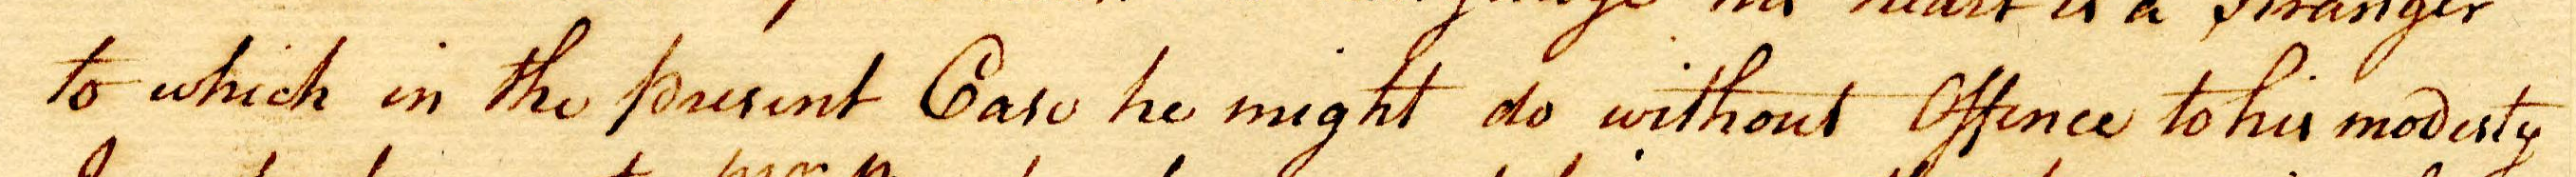to which in the present Case he might do without Offence to his modesty
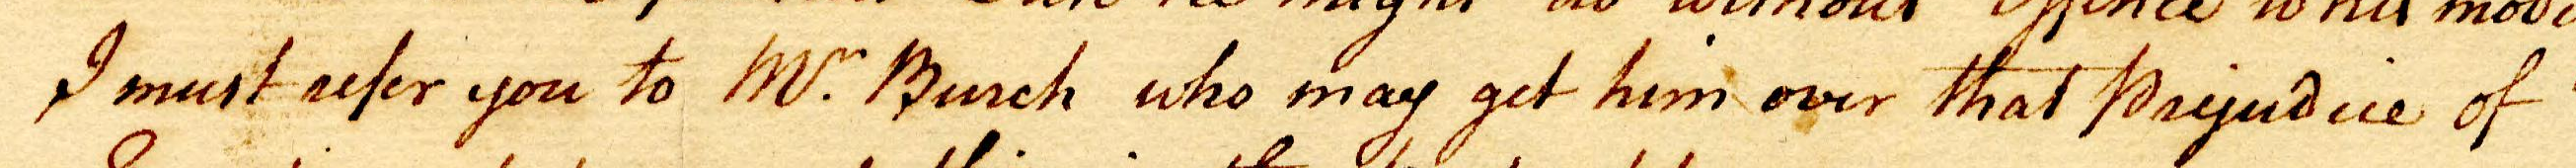I must refer you to M^rs. Burch who may get him over that prejudice of
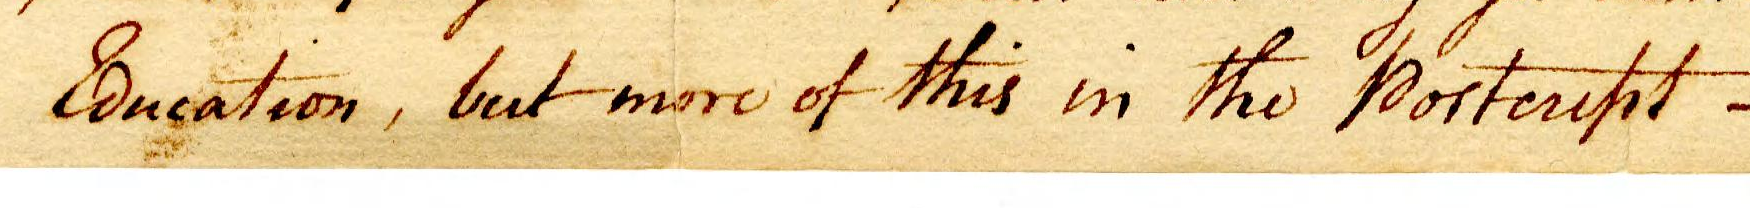Education, but more of this in the Postscript
